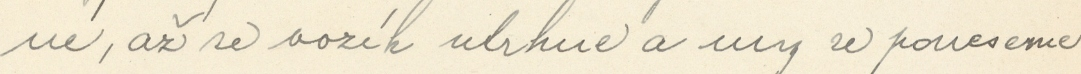né, až se vozík utrhne a my se poneseme
